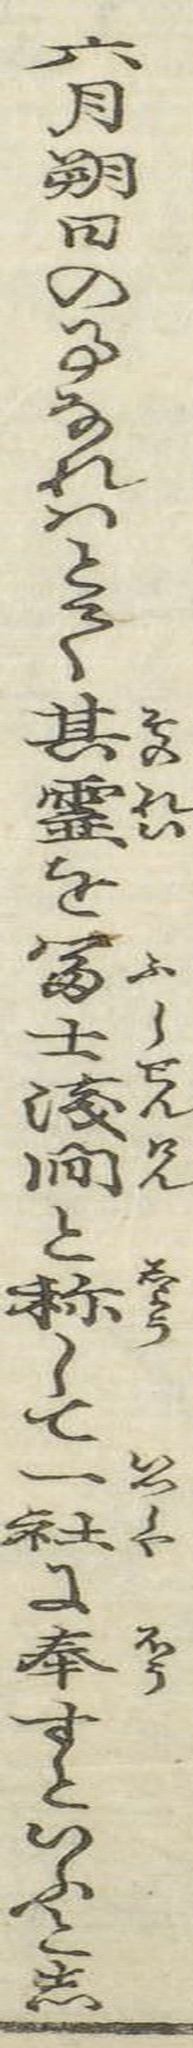六月朔日の事なれはとて其霊を富士浅間と称して一社に奉すといふとし
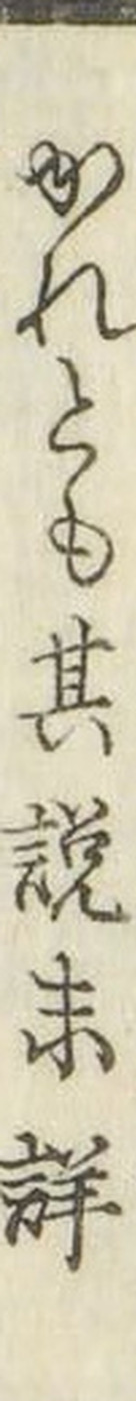かれとも其説未詳
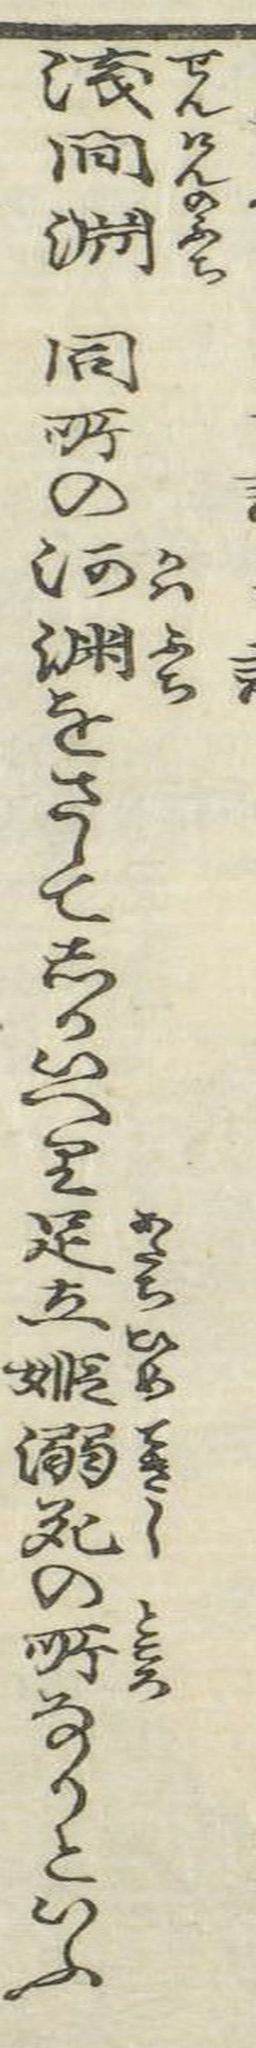浅間淵同所の河淵をさしてしかいへり足立姫溺死の所なりといふ
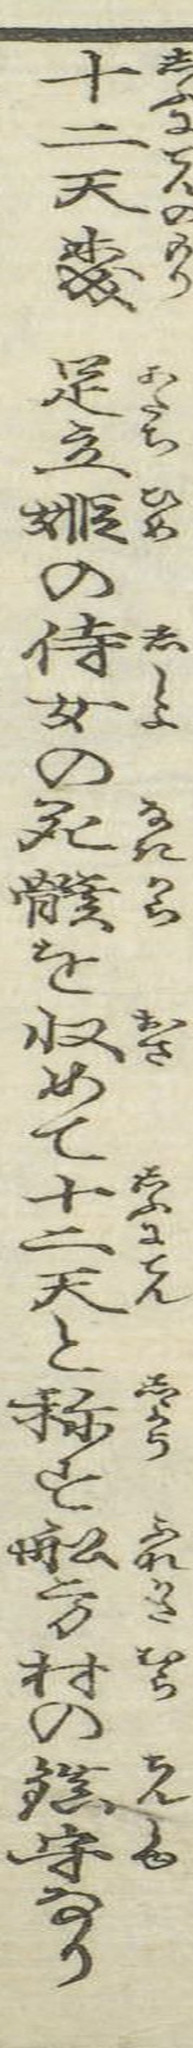十二天森足立姫の侍女の死骸を収めて十二天と称す船方村の鎮守なり
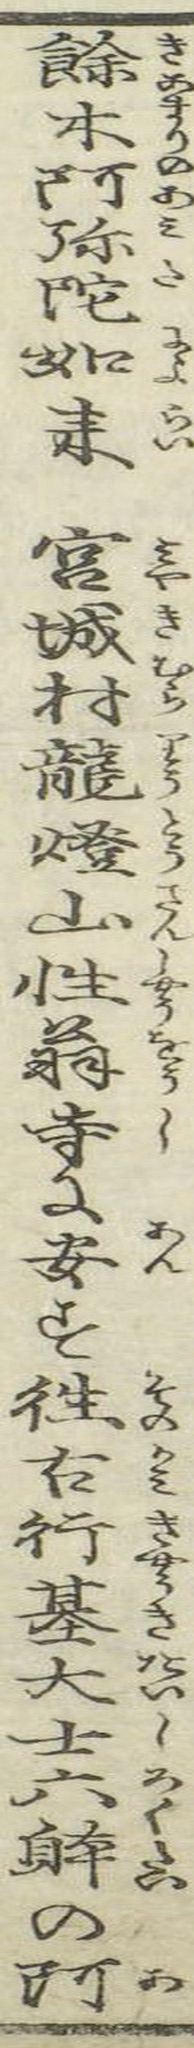余木阿弥陀如来宮城村龍燈山性翁寺に安す往古行基大士六体の阿
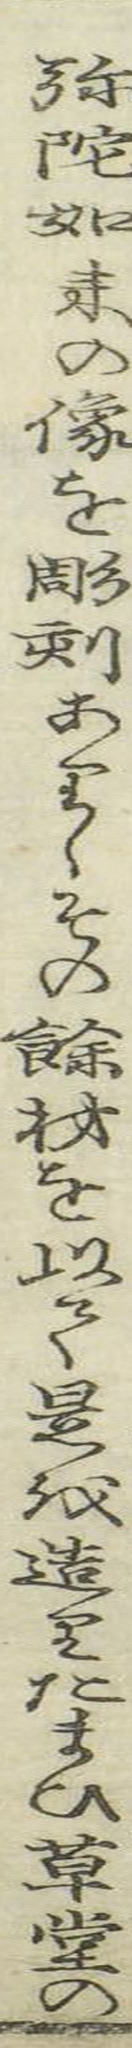弥陀如来の像を彫刻ありしその余材を以て是を造りたまひ草堂の
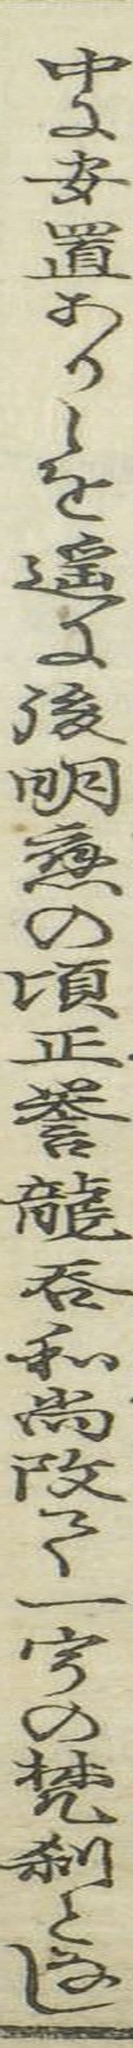中に安置ありしを遥に後明応の頃正誉龍呑和尚改て一宇の梵刹となし

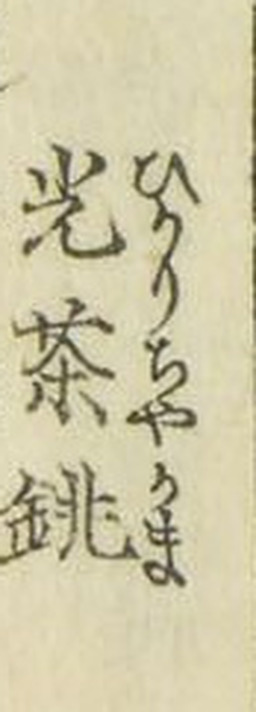光茶銚
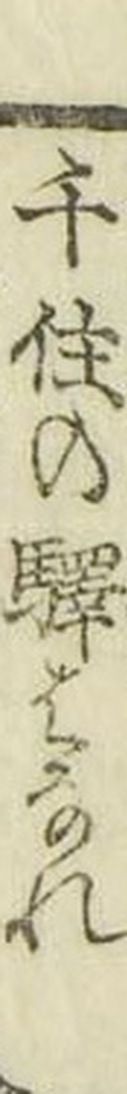千住の駅はなれ
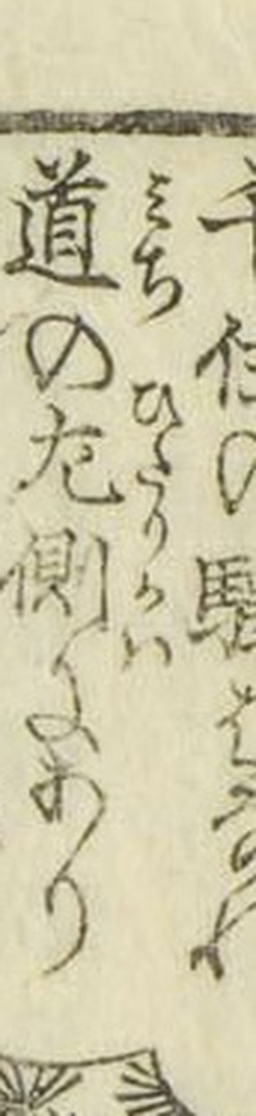道の左側にあり
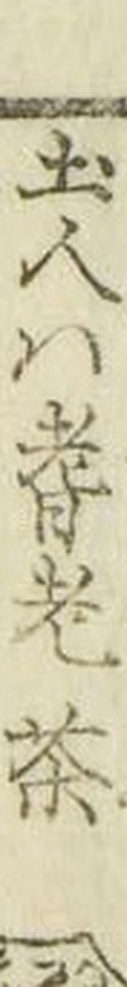土人は耆老茶
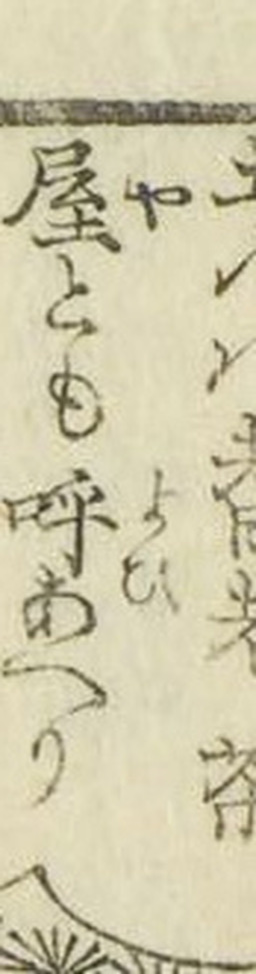屋とも呼あへり
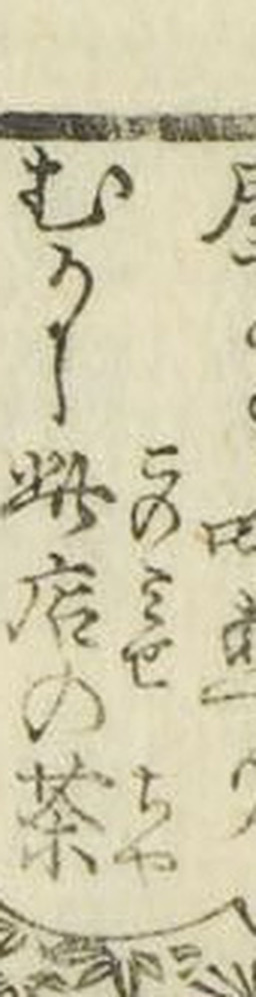むかし此店の茶
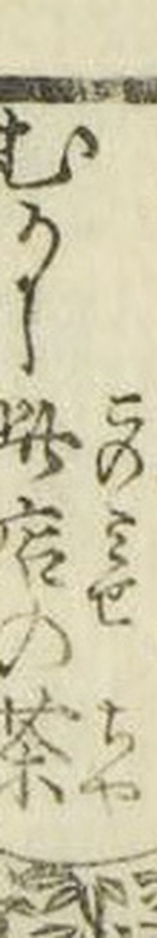むかし此店の茶
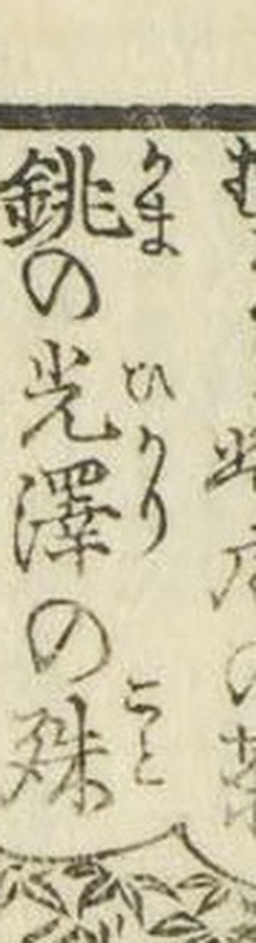銚の光沢の殊
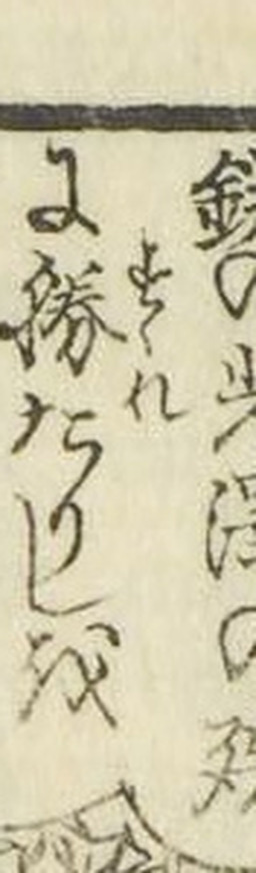に勝たりしを
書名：江戸名所図会 20巻 巻之17
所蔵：東京学芸大学教育コンテンツアーカイブ
